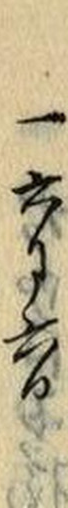一六月六日
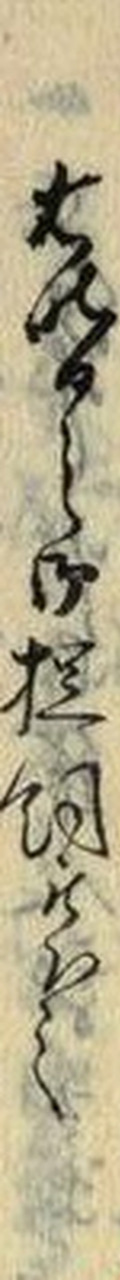右昨日之御捉飼被下之
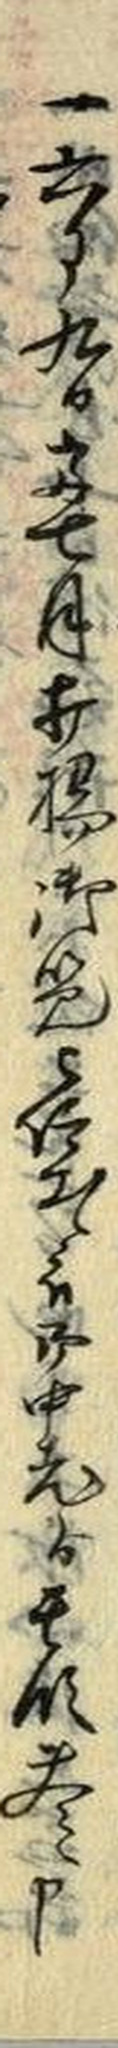一六月九日当七月打揚御御覧被仰付候ニ付御中老ゟ其段夫々へ申
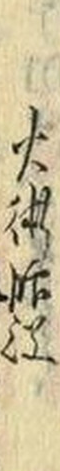火術師役
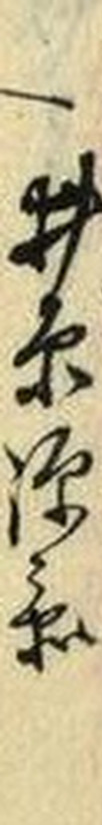井原源兵衛
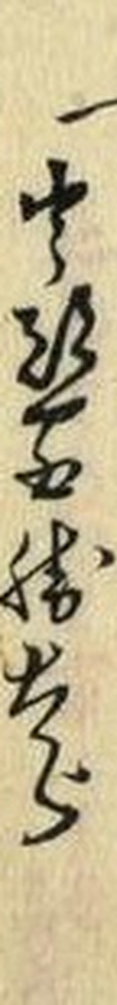宇都宮勝太郎
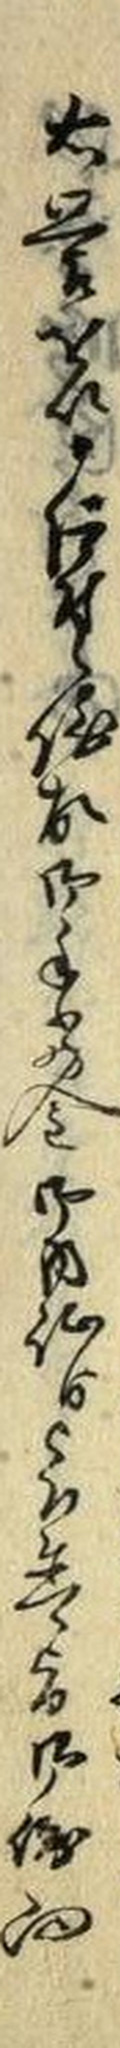右思召を以被仰付候儀故御手当金御内証ゟ被下置候旨御側向

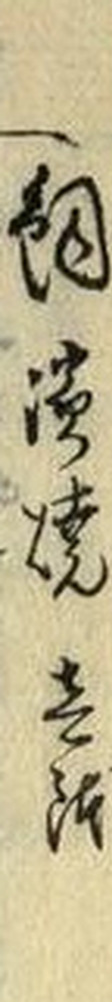鯛浜焼壱鉢
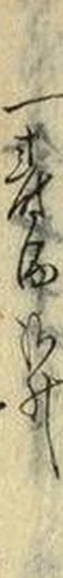寿酒弐升
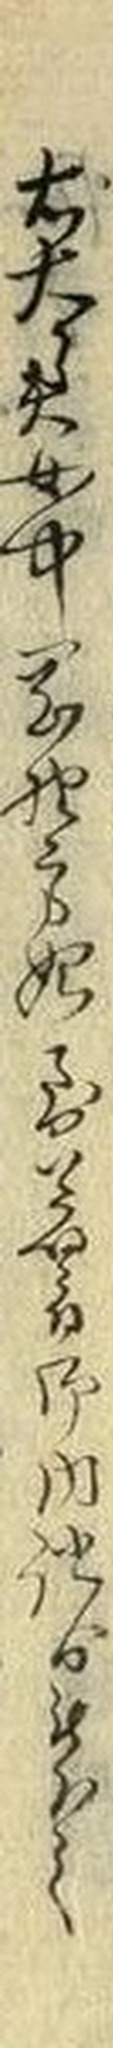右大奥女中岡野方始到着ニ付御内証ゟ被下之
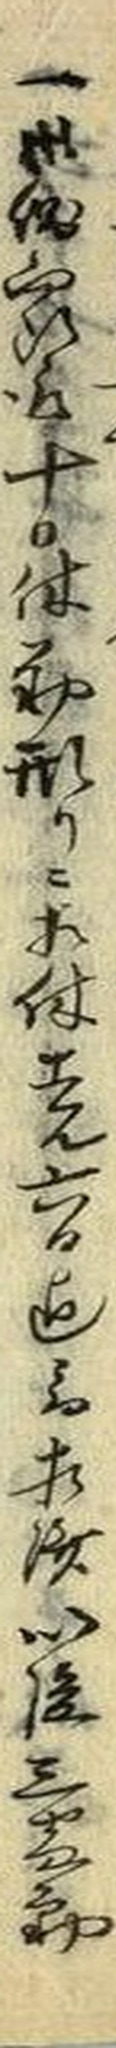一御側向頭取十日休勤形りニ相休去ル六日迄ニ而相済以後三番勤
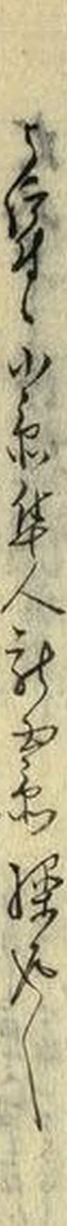被仰付候小兵衛隼人新五兵衛繰返〳〵
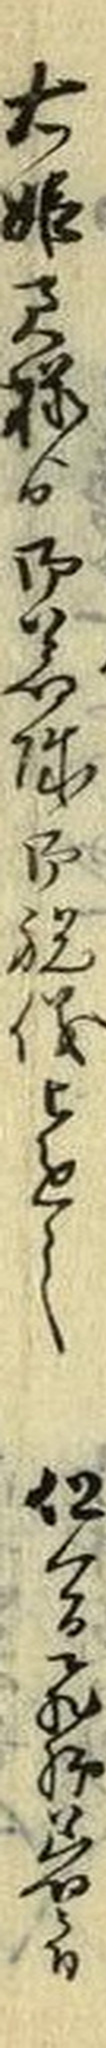右姫君様ゟ御着城御祝儀被進之但今日飛脚着ニ付
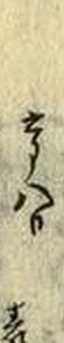六月八日
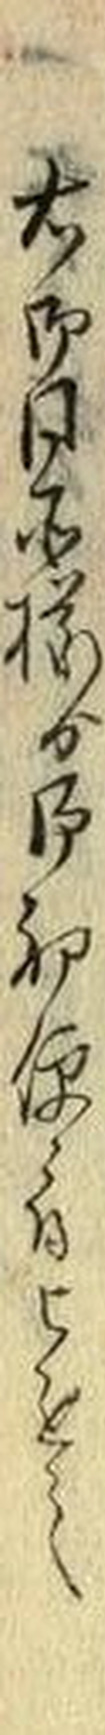右御同所様ゟ御初便ニ付被進之
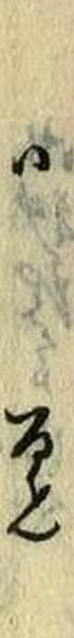同百疋
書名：少傅日録抄（斉承付側向頭取日記、在国）
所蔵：福井県文書館 Fukui Prefectural Archives
